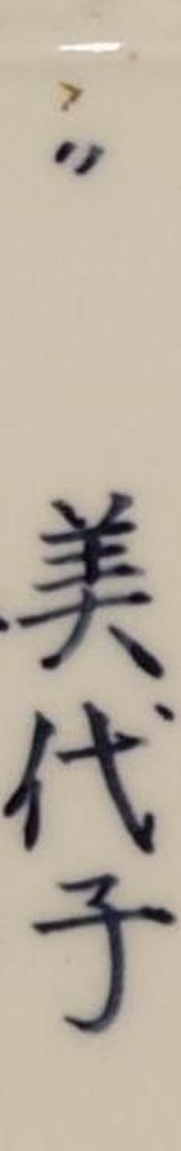美代子
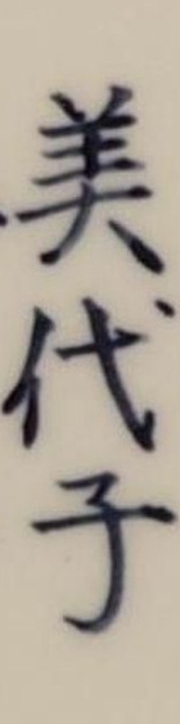美代子
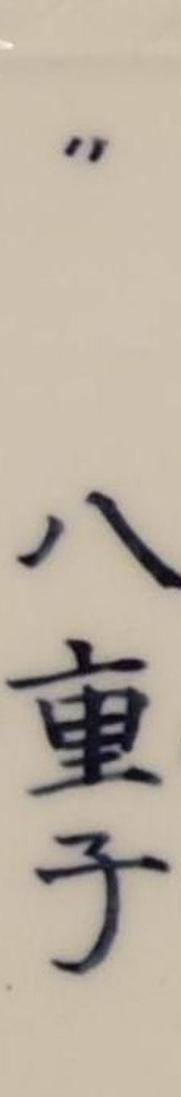八重子
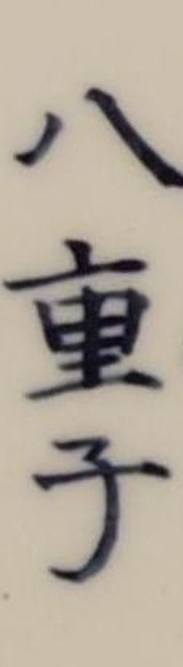八重子
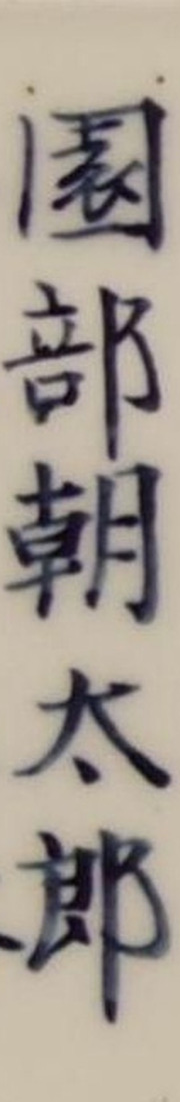園部朝太郎
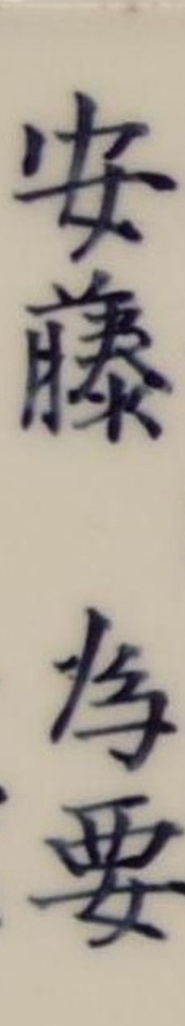安藤為要

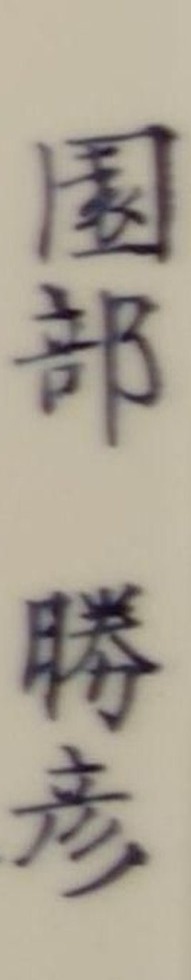園部勝彦
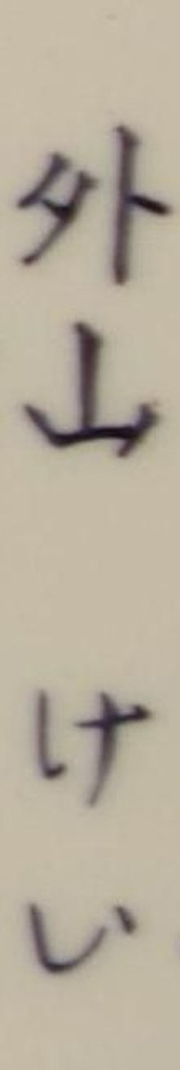外山けい
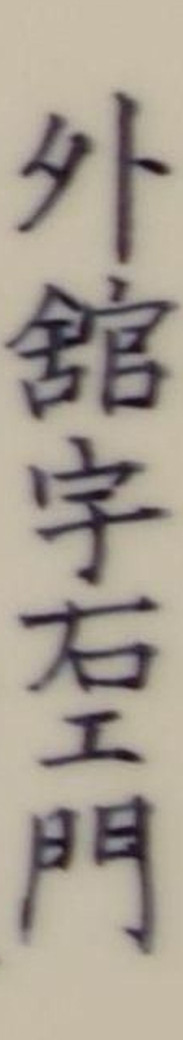外館宇右エ門
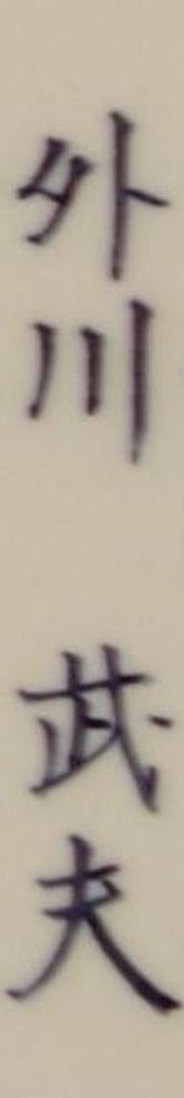外川武夫
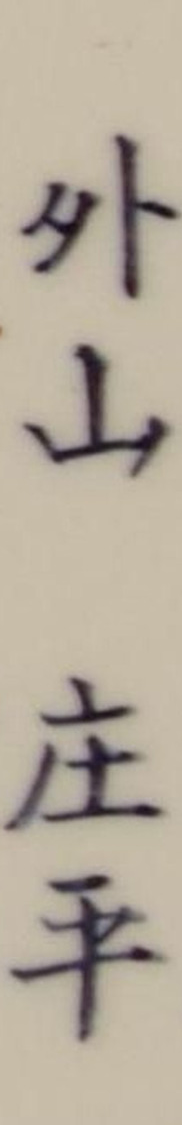外山庄平
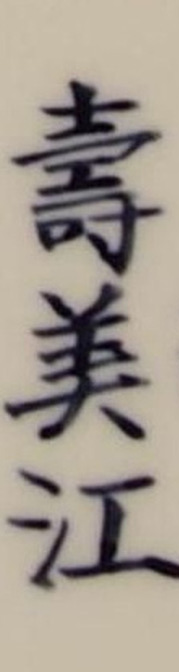壽美江
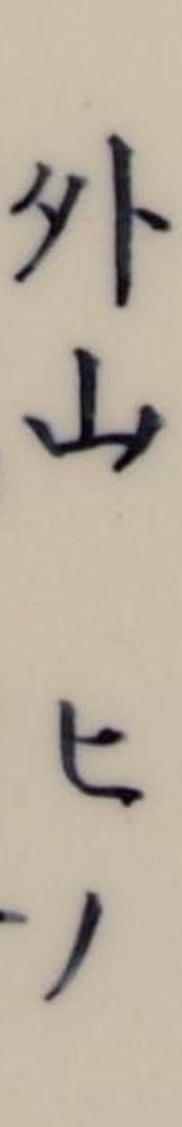外山ヒノ
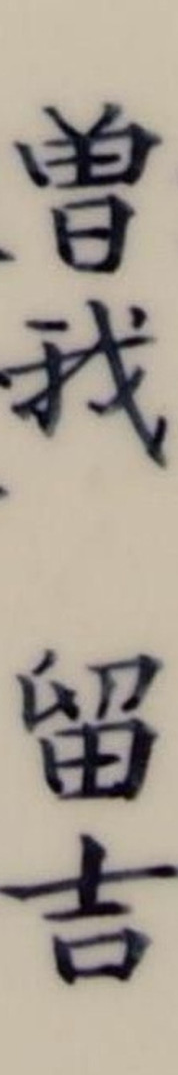曽我留吉
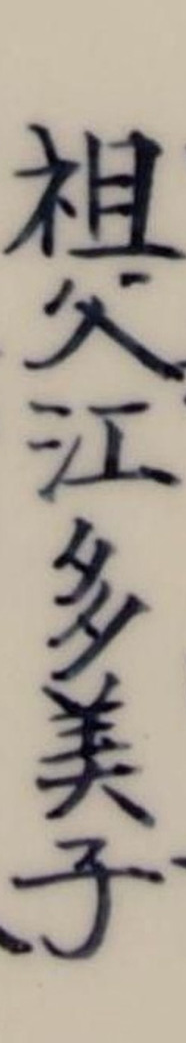祖父江多美子
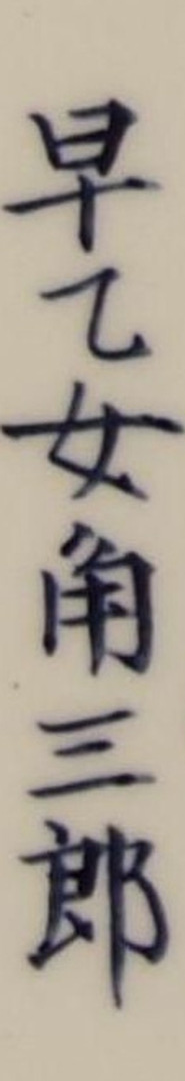早乙女角三郎
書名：E~L
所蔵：高野山金剛峯寺
